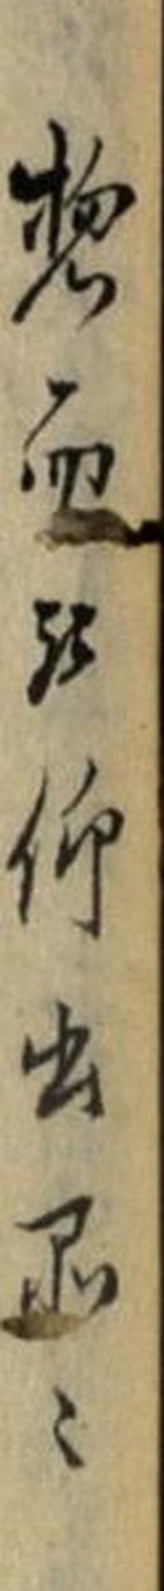惣而被仰出品々
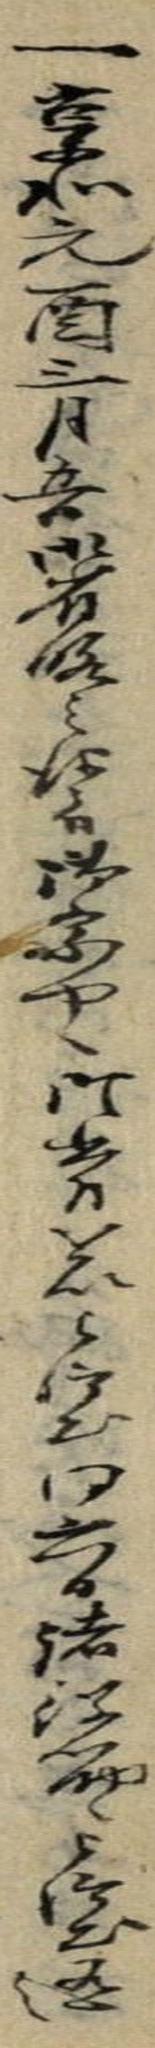一享和元酉三月五日御省略之儀に付御家中へ御書付を以被仰出同六日諸役筋へ被仰出有之
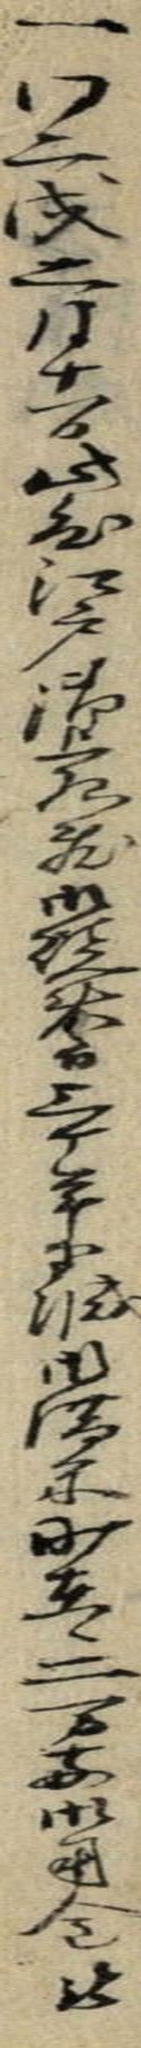一同二戌二月十一日此度江戸御上屋敷御焼失に付三ヶ年半減御借米町在へ二万両御用金被
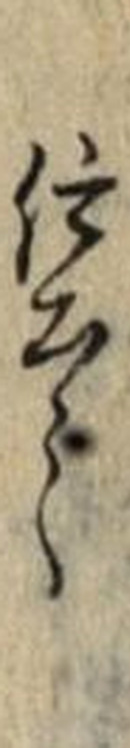仰出之
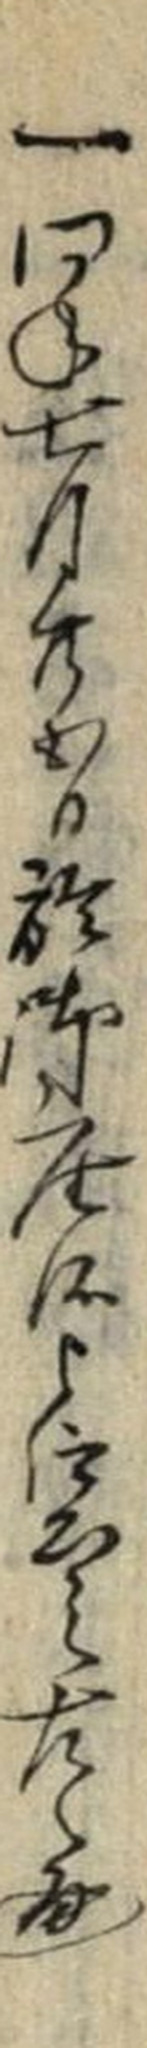一同年七月廿五日於御座所被仰出之左之通
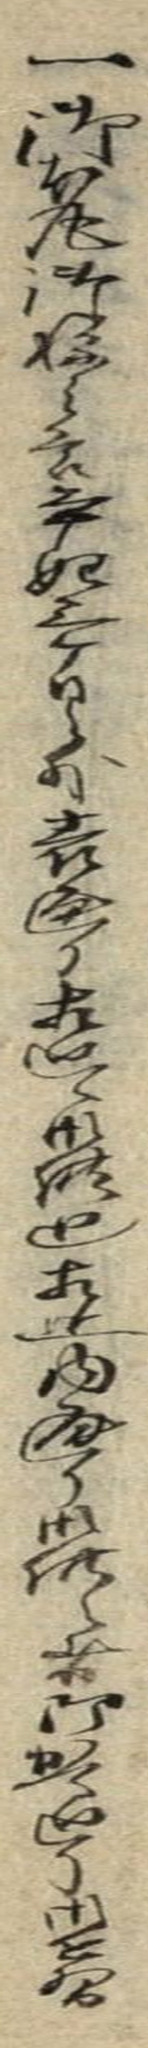一御本丸御移之節年始三ケ日之外表通り相廻候御供廻相止内通り御供之者御駕廻り御近習
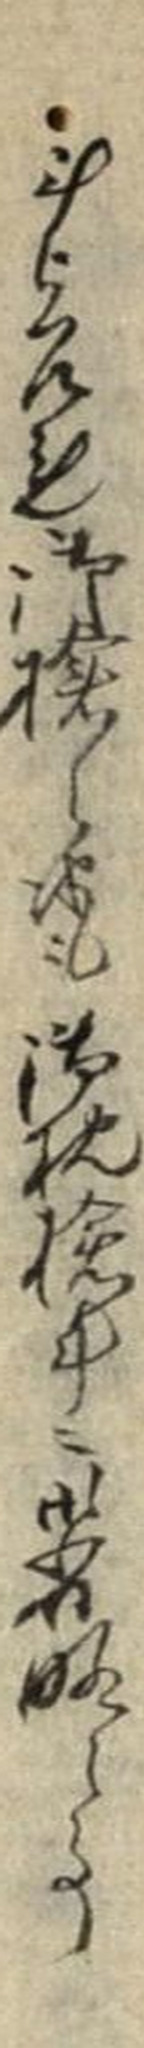斗被召進御槍之儀も御枕槍斗に御省略之事
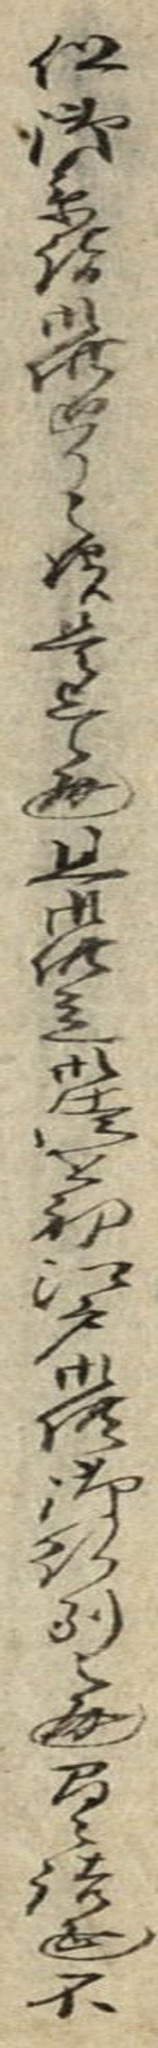但御参詣御供廻り之儀は是迄之通且御供立御徒を初江戸御供御行列之通間々詰延込不
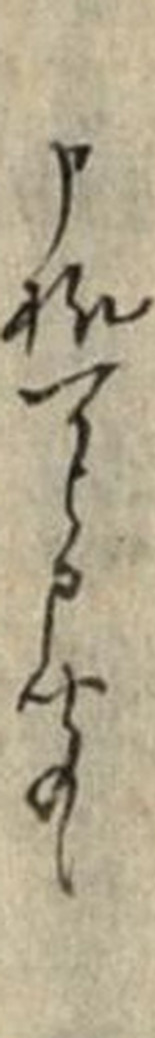申様可被申聞候
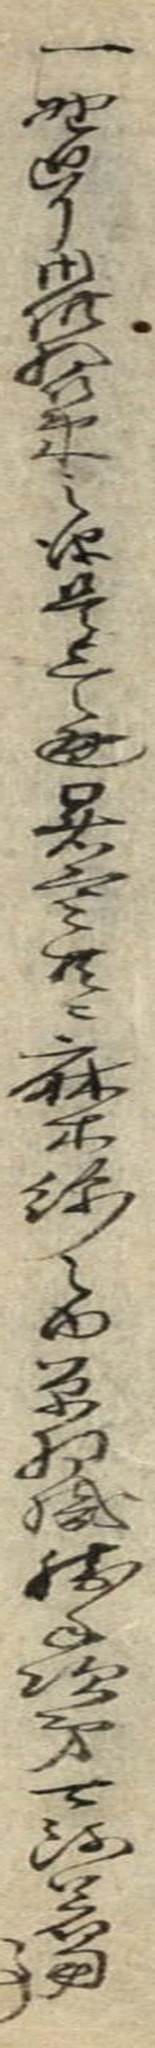一野廻り御供装束之儀是迄之通暑寒共に麻木綿之内単羽織勝手次第可致着用事
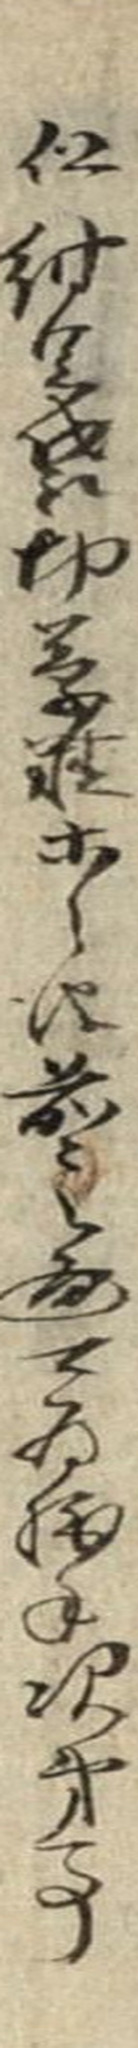但紺足袋切草鞋等之儀前々通可為勝手次第事
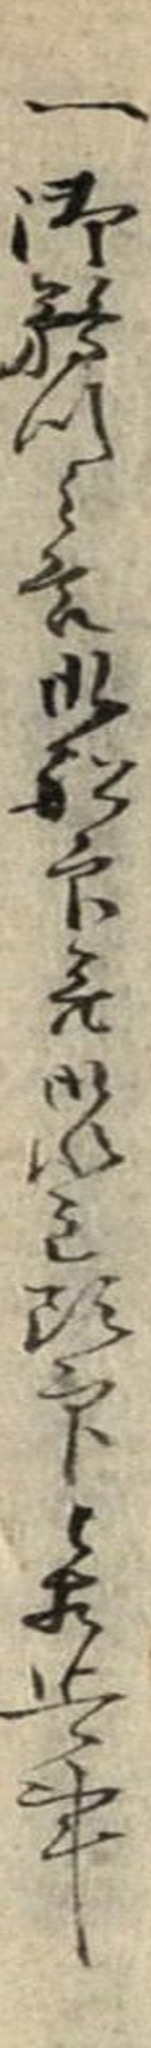一御鵜川之節御船印并御水主頭印被相止候事
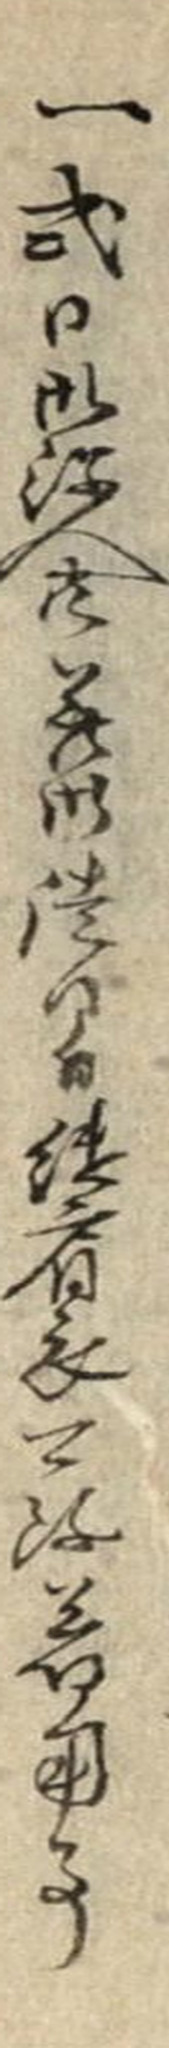一式日御役人共并御徒目付継肩衣可致着用事
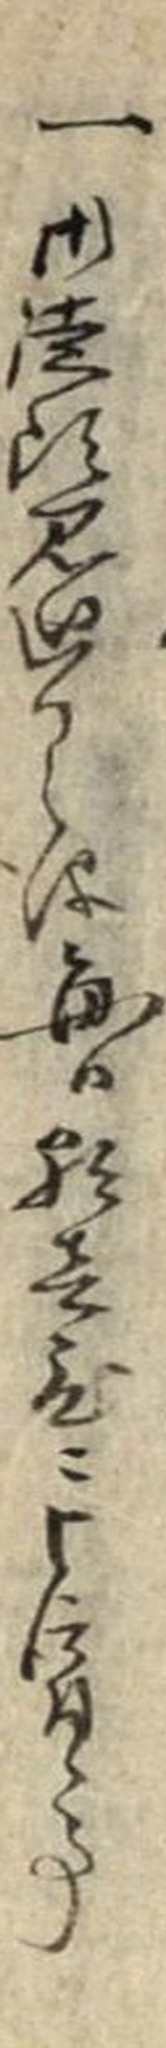一御徒頭見廻り候儀毎日朝壱度に被仰付候事
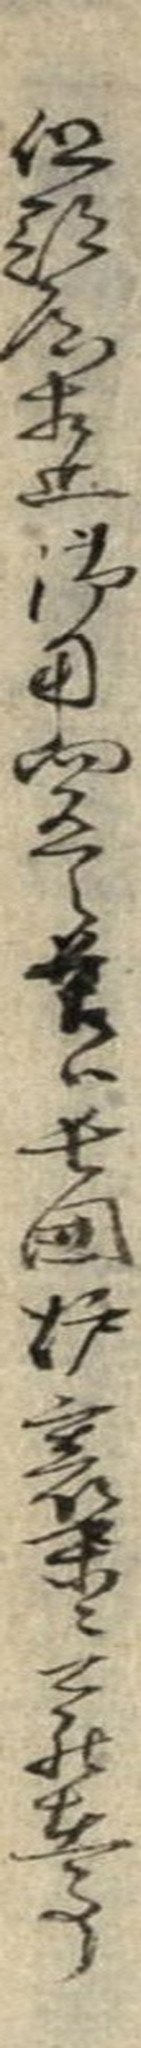但部屋相止御用向有之節は長囲炉裏末に可罷在事
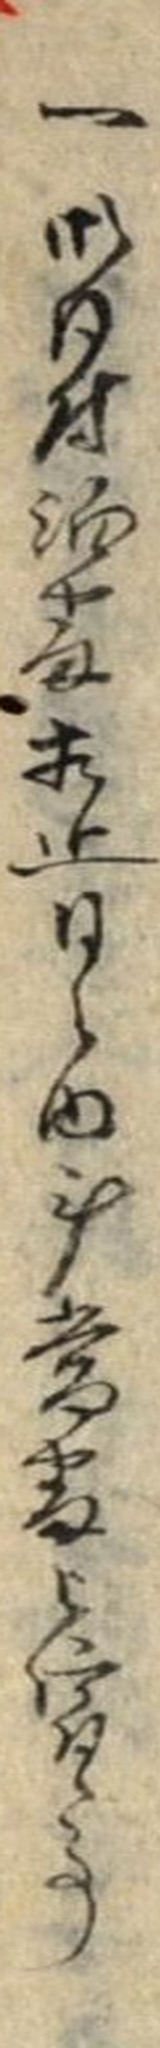一御目付泊番相止日之内斗当番被仰付候事
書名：御用并被仰出之部
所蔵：福井県文書館 Fukui Prefectural Archives
